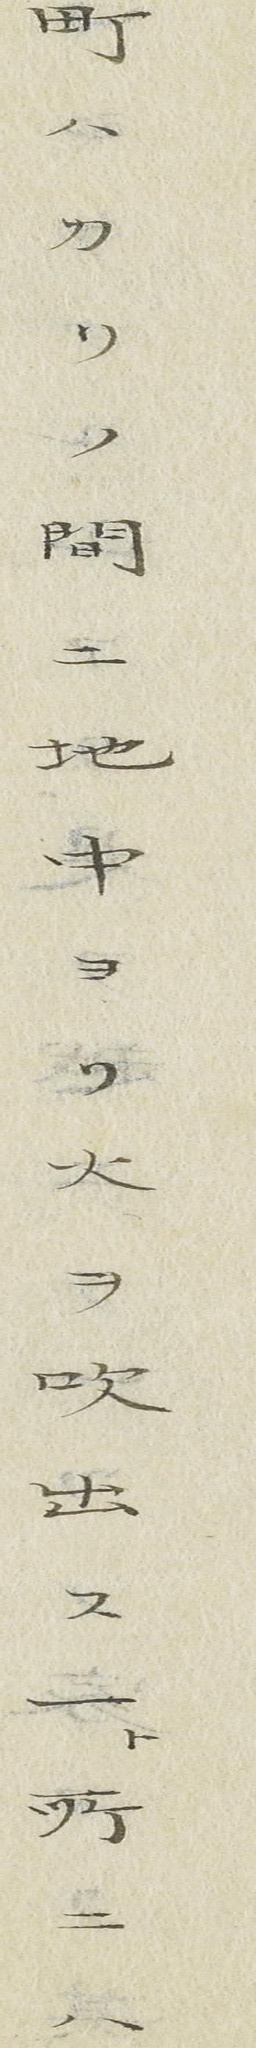町ハカリノ間ニ地中ヨリ火ヲ吹出ス一ト所ニハ
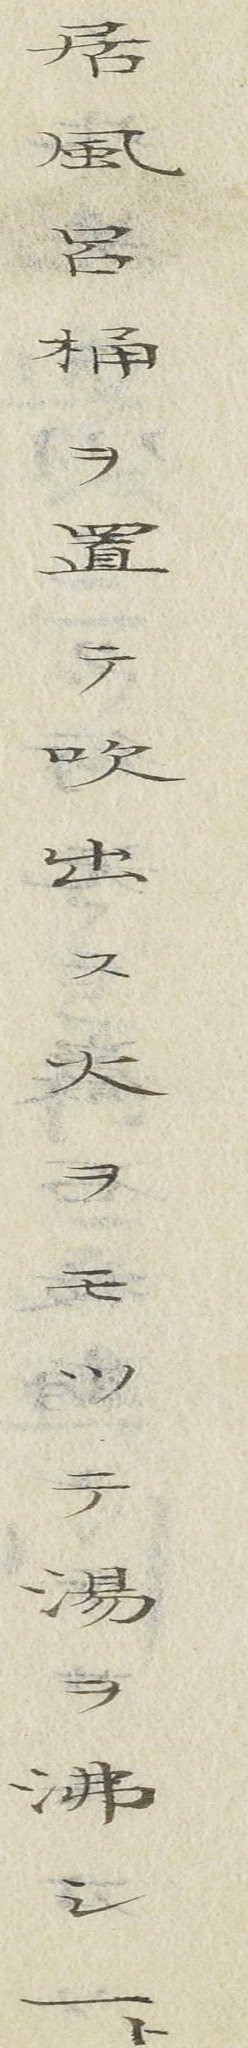居風呂桶ヲ置テ吹出ス火ヲモツテ湯ヲ沸シ一ト
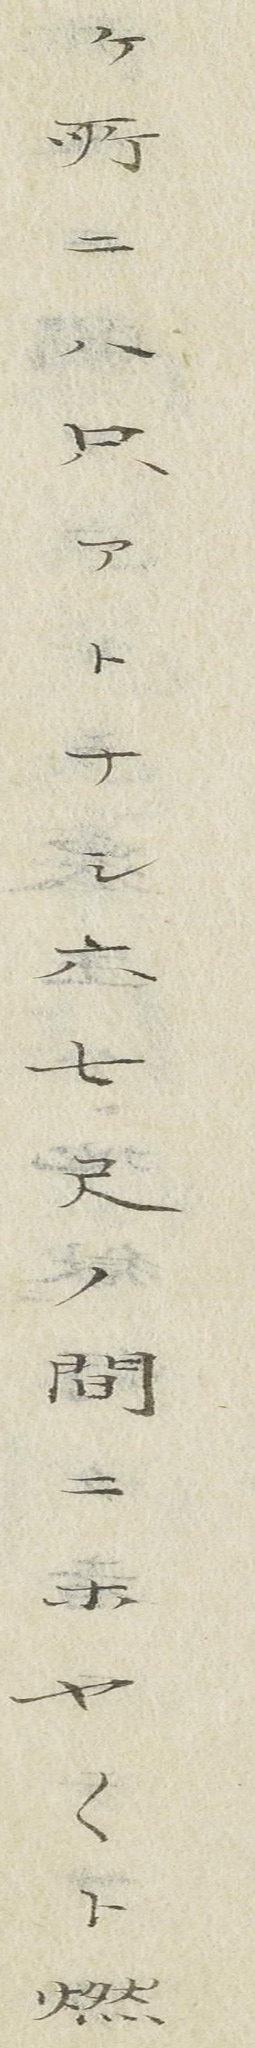ケ所ニハ只アトナシ六七尺ノ間ニホヤ〱ト燃
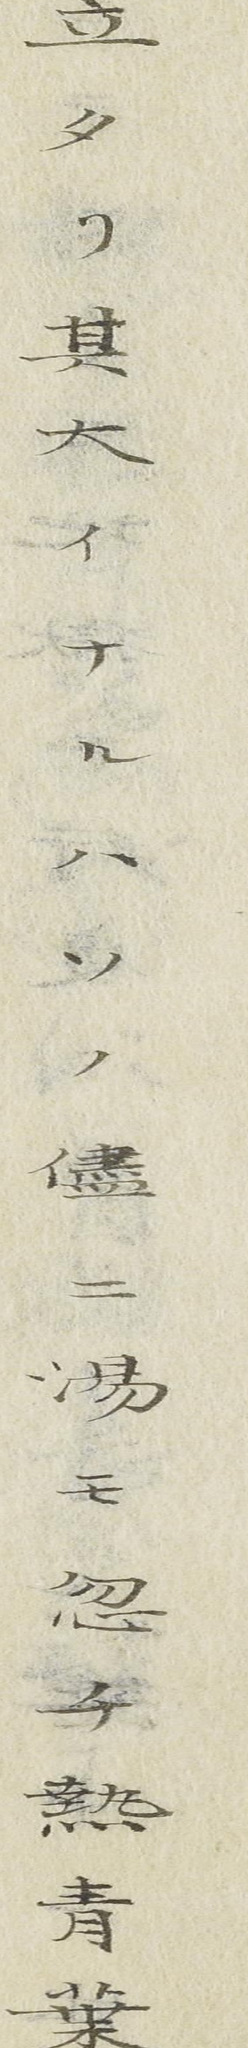立タリ其大イナルハソノ侭ニ湯モ忽チ熱青葉
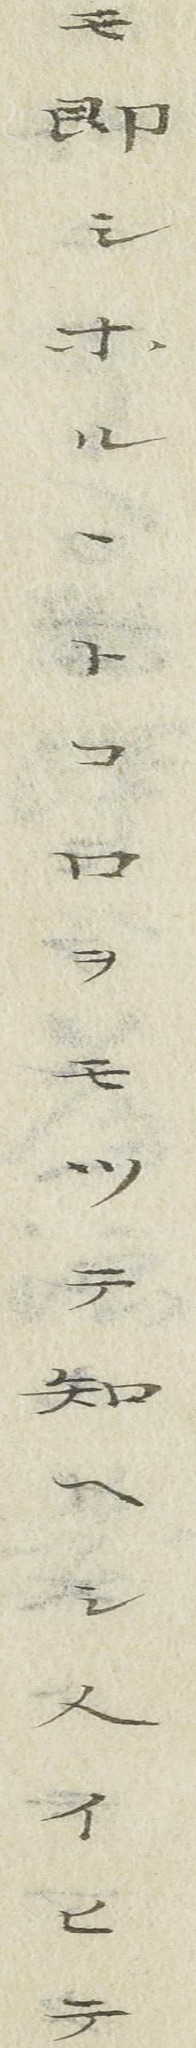モ即シホルヽトコロヲモツテ知ヘシ人イヒテ
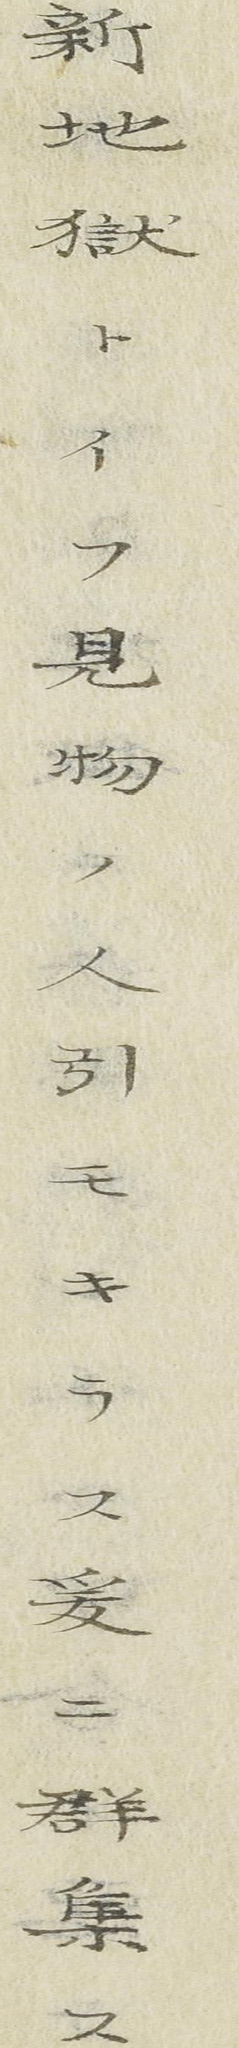新地獄トイフ見物ノ人引モキラス爰ニ群集ス
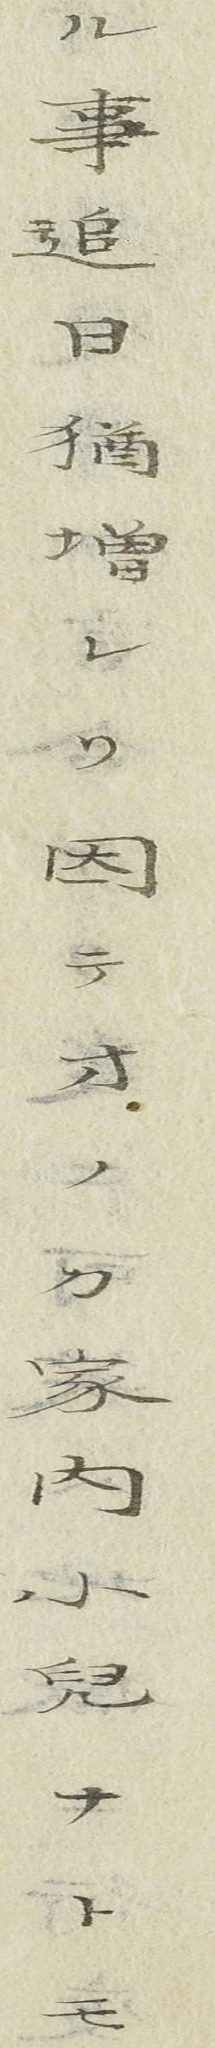ル事追日猶増レリ因テオノカ家内小児ナトモ

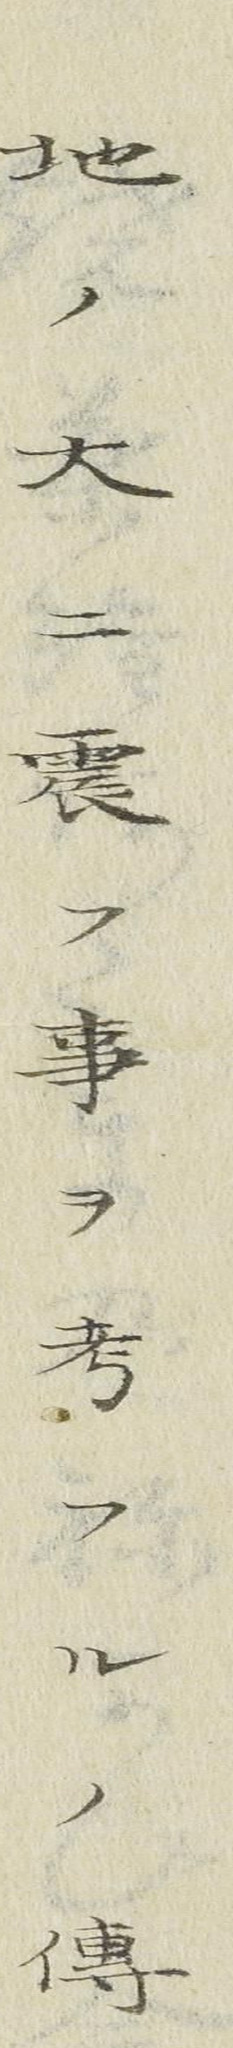地ノ大ニ震フ事ヲ考フルノ伝
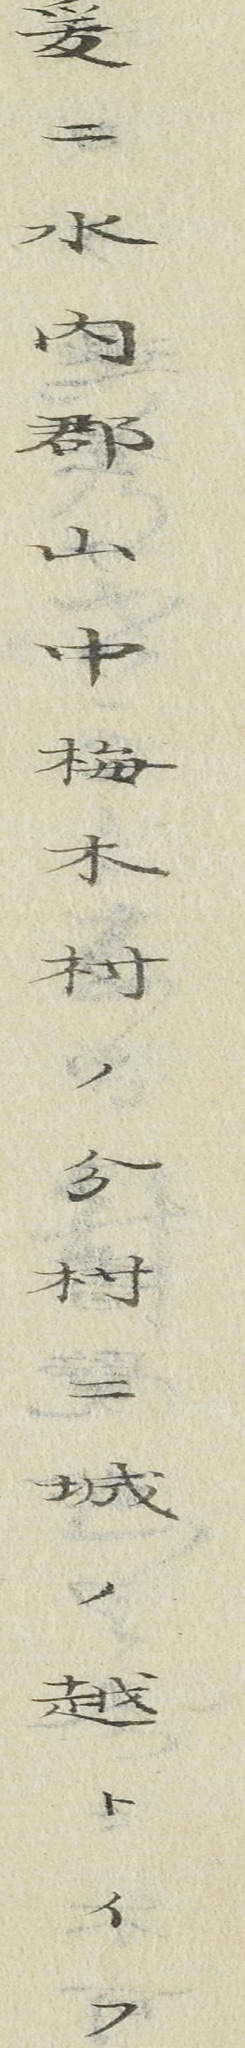爰ニ水内郡山中梅木村ノ今村ニ城ノ越トイフ
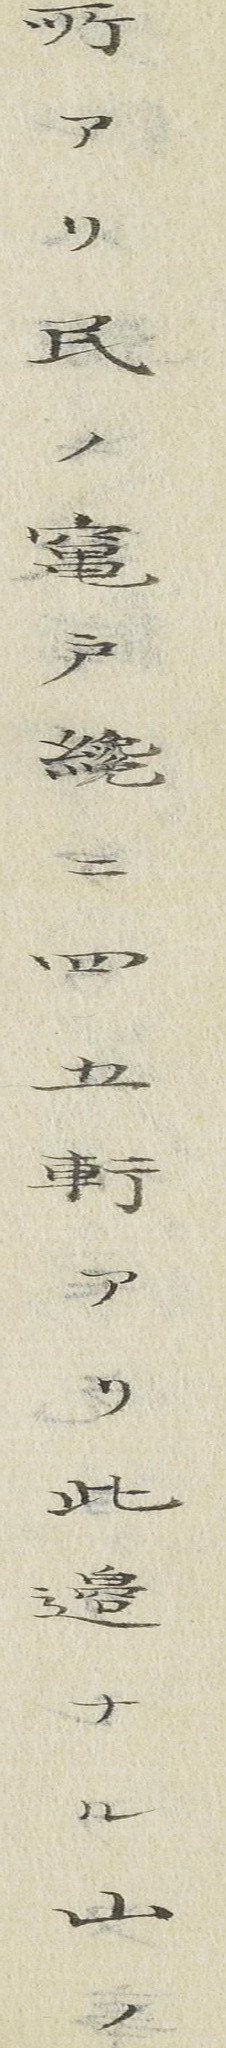所アリ民ノ竃戸纔ニ四五軒アリ此辺ナル山ノ
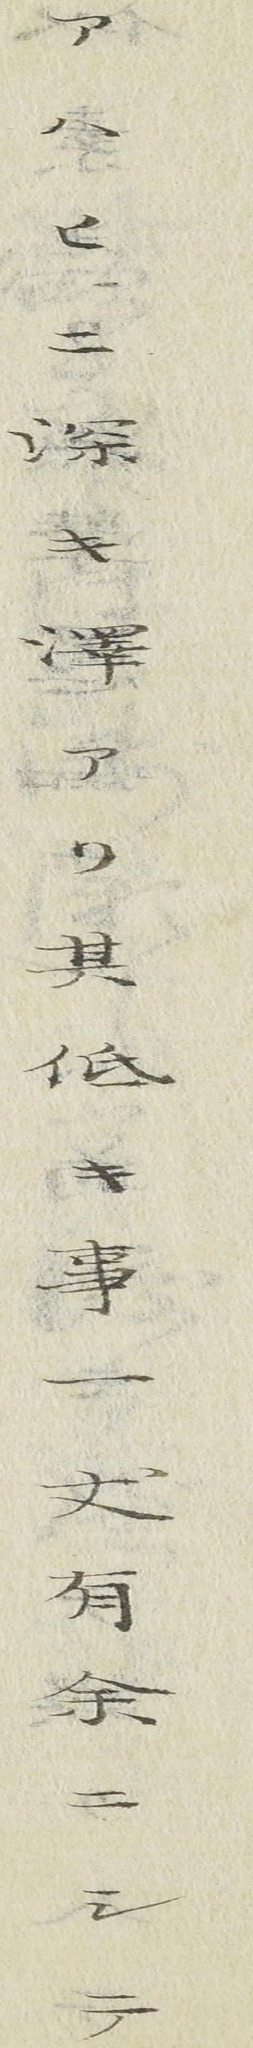アハヒニ深キ沢アリ其低キ事一丈有余ニシテ
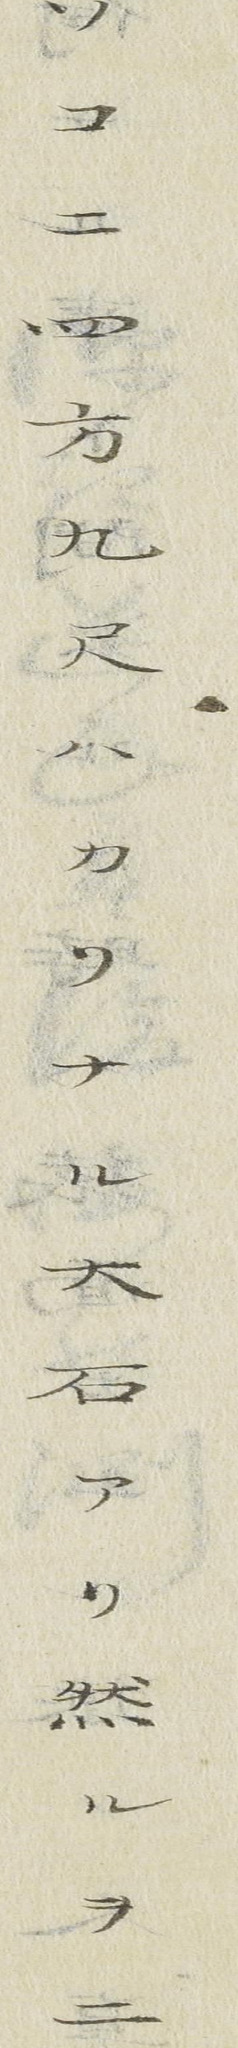ソコニ四方九尺ハカリナル大石アリ然ルヲニ
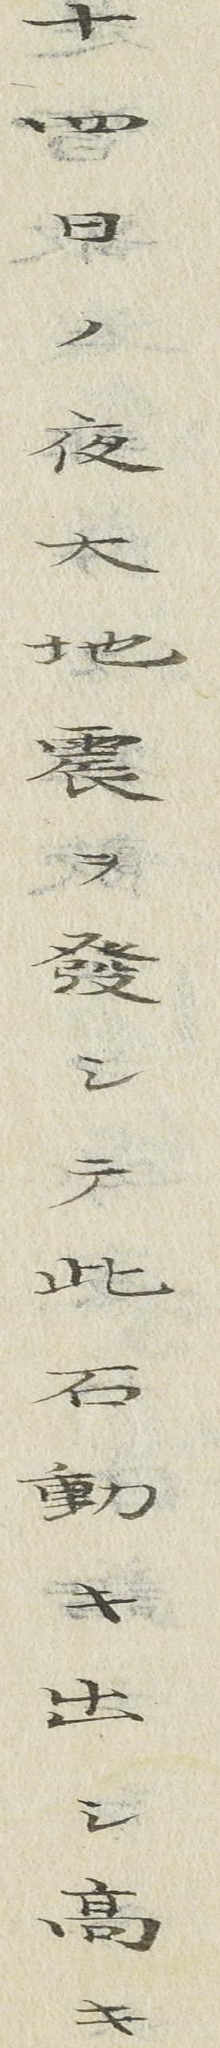十四日ノ夜大地震ヲ発シテ此石動キ出シ高キ
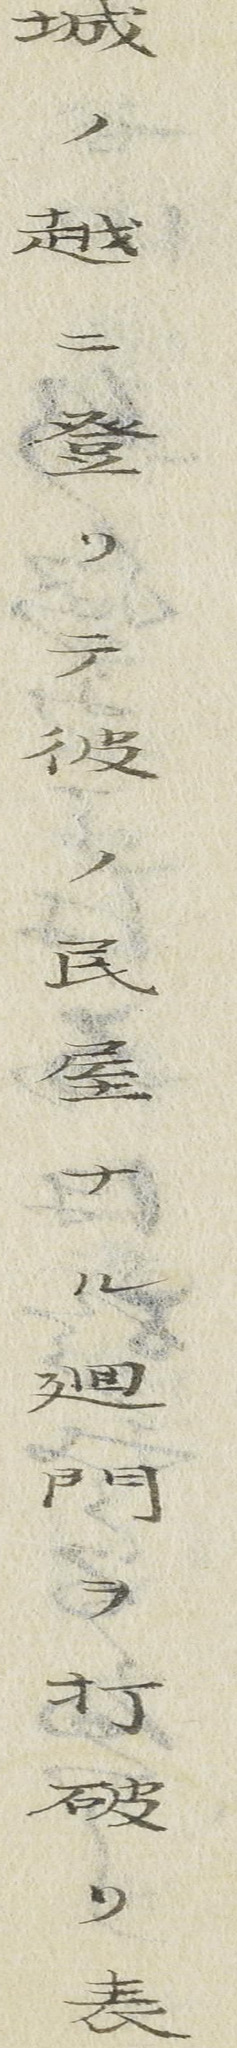城ノ越ニ登リテ彼ノ民屋ナル廻門ヲ打破リ表
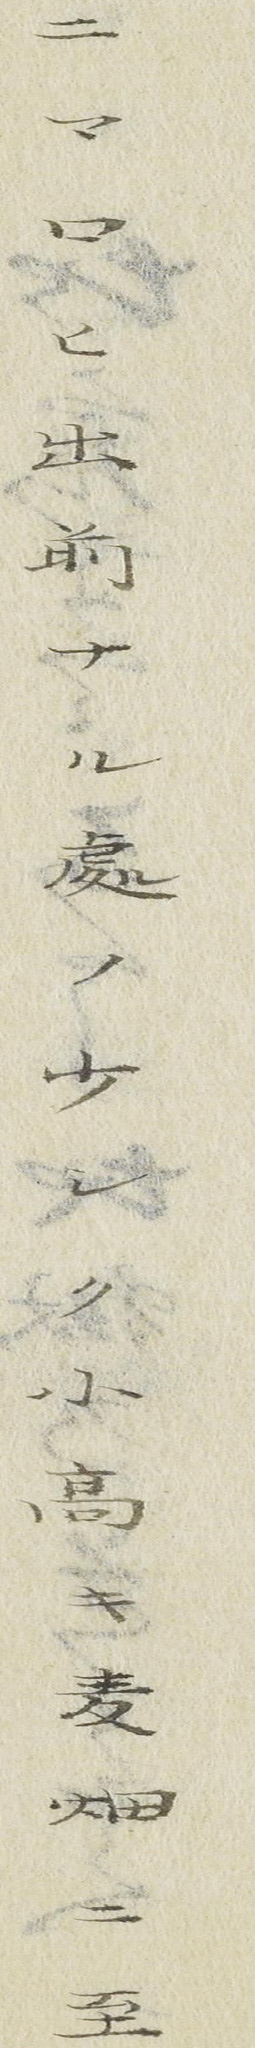ニマロヒ出前ナル処ノ少シク小高キ麦畑ニ至
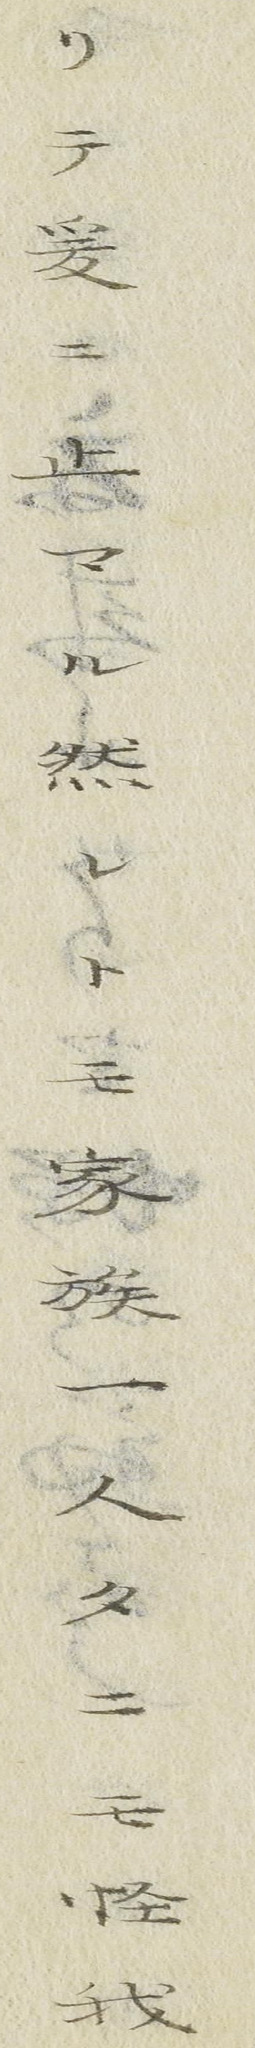リテ爰ニ止マル然レトモ家族一人タニモ怪我
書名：地災撮要　地震之部　巻ノ二
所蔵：東京大学地震研究所図書室 Earthquake Research Institute Library, The University of Tokyo, JAPAN
